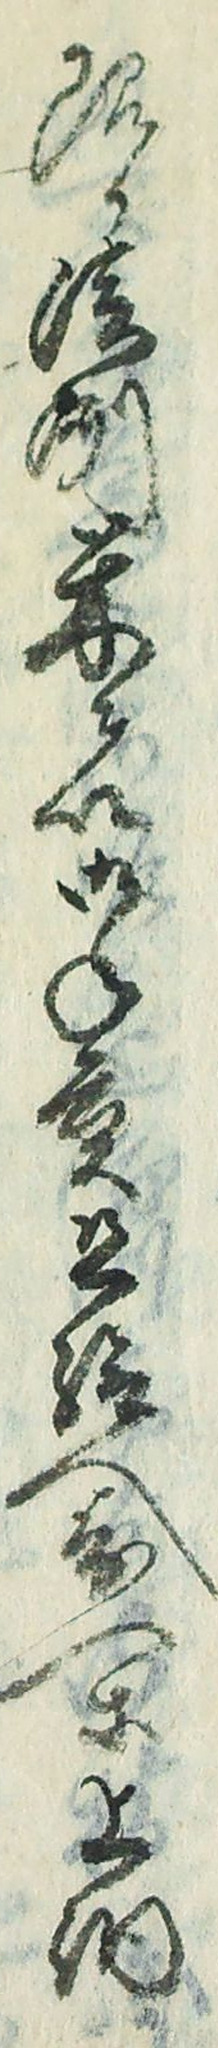限り淡州米ヲ以御年貢且給人歩一等上納
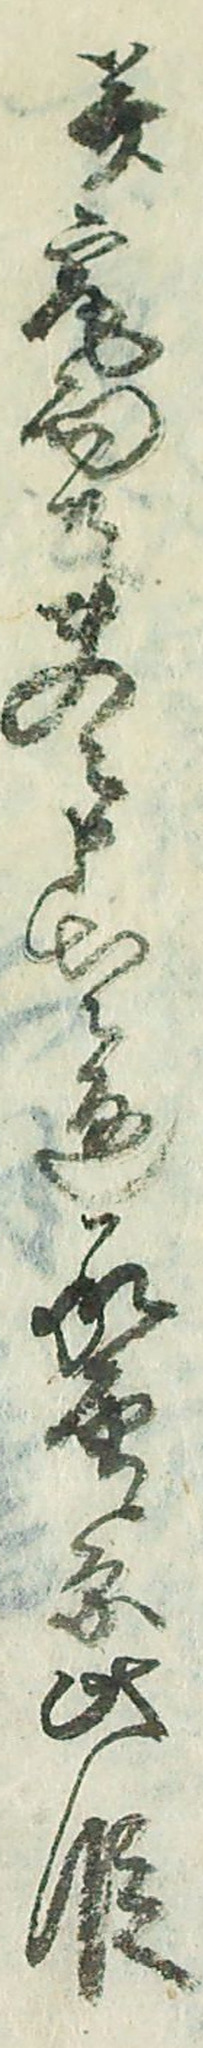幷究向共夫々申出之通承届候条此段
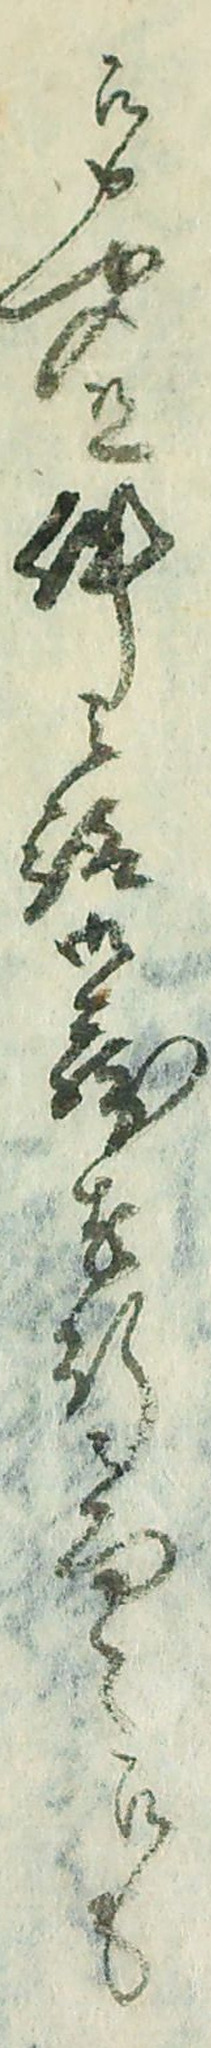被申聞且件之趣御蔵奉行之面々江も
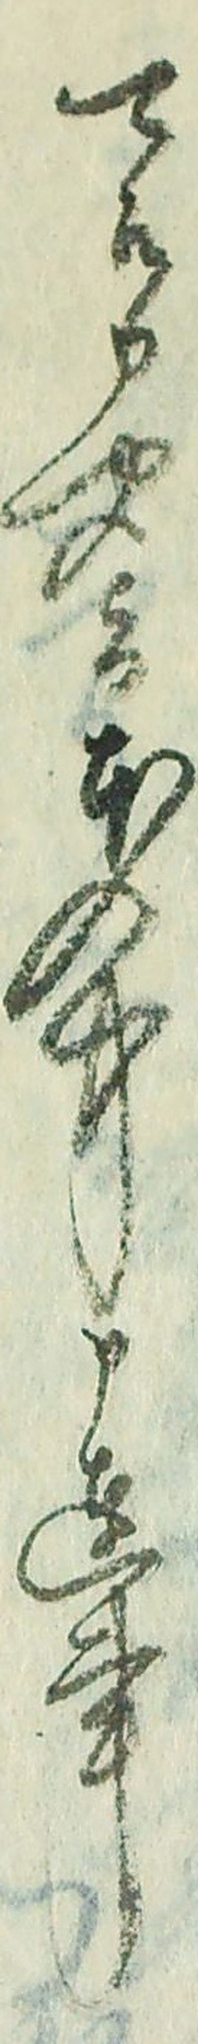可被申聞旨本〆中申達事
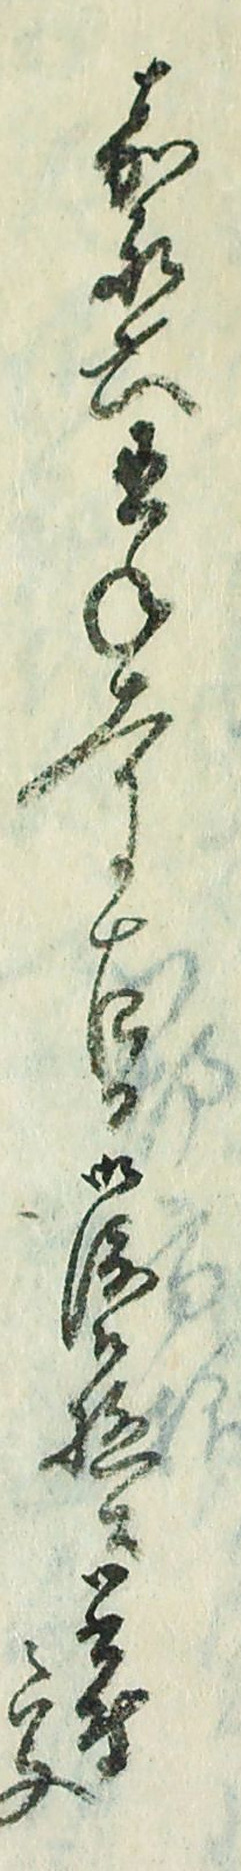嘉永六丑年十一月十四日御渡被遊候御書付之写

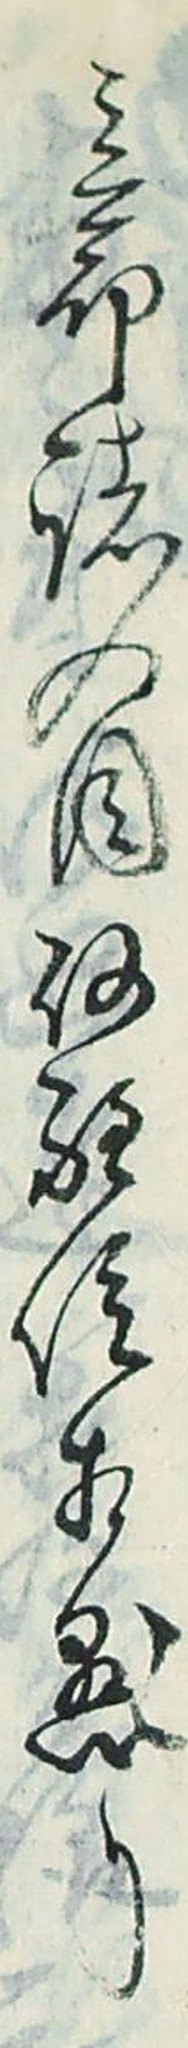之節諸入目何程位相懸り
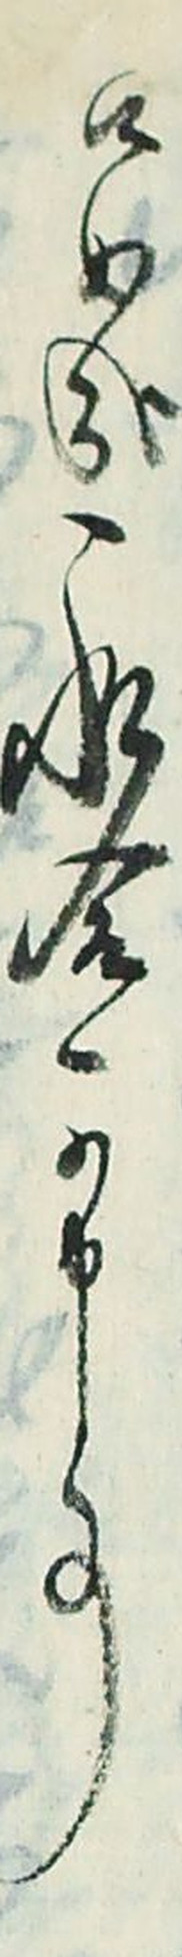候義哉承合可申事
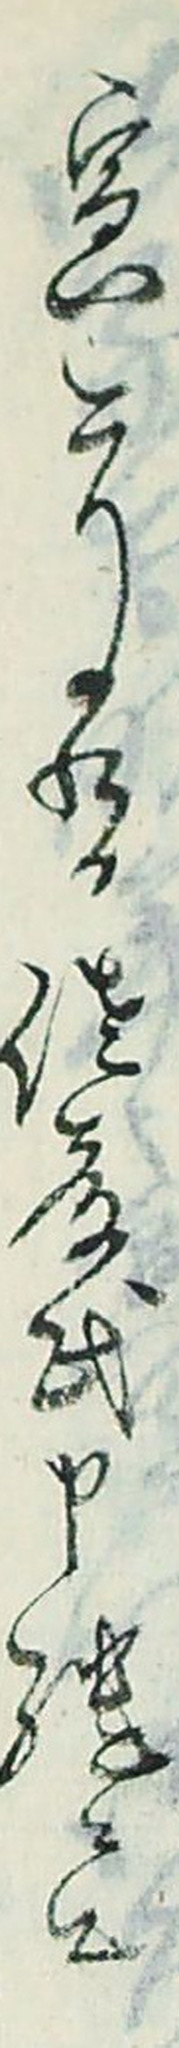寅二月九日佐藤氏申継ニ候

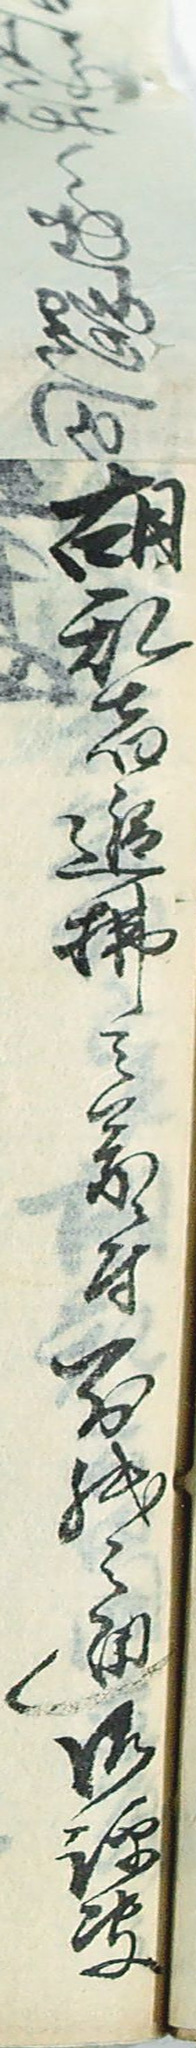胡乱者追拂之義ニ付別紙之通御評決
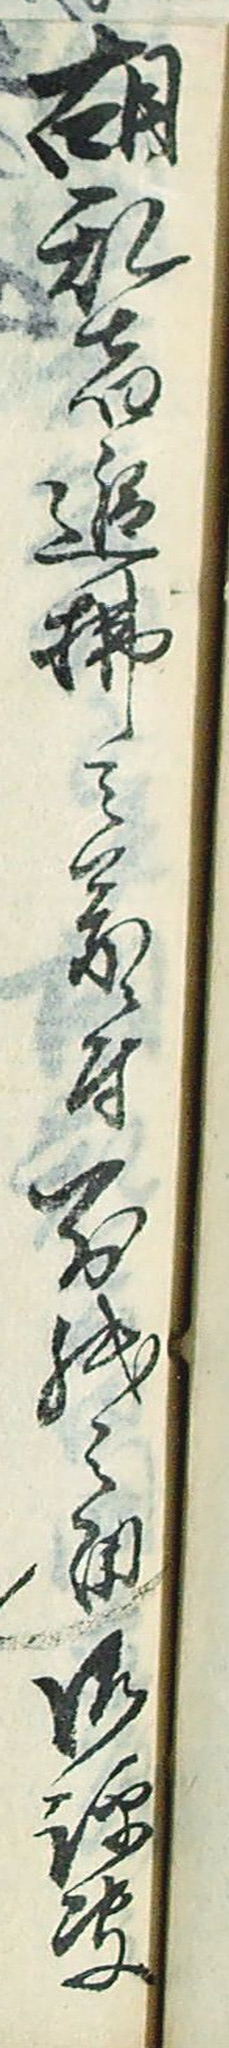胡乱者追拂之義ニ付別紙之通御評決
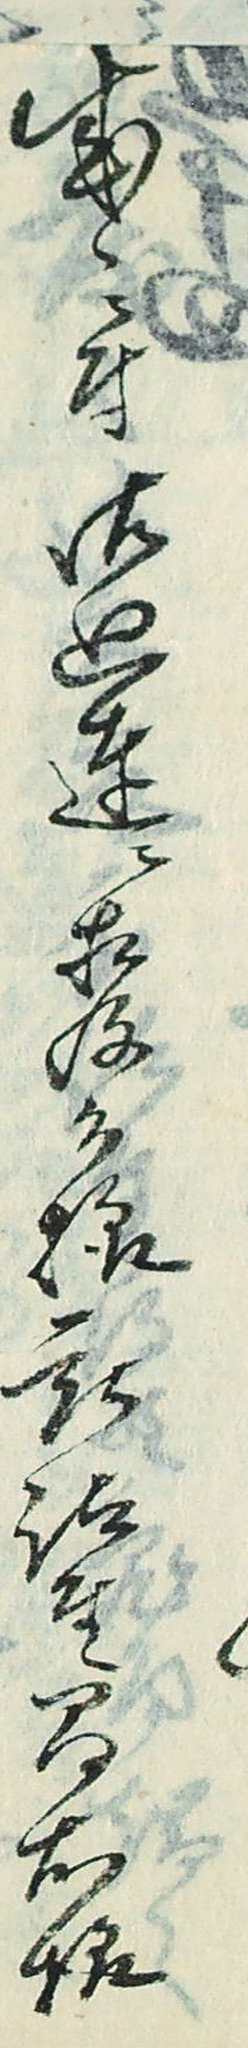成候ニ付御廻達ニ相及候様被仰付候間右様
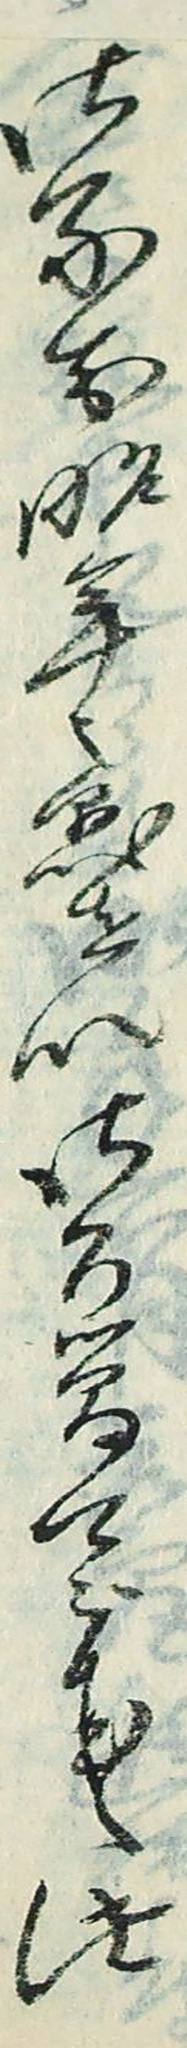御承知昨年之懸を以御了簡可被成候御
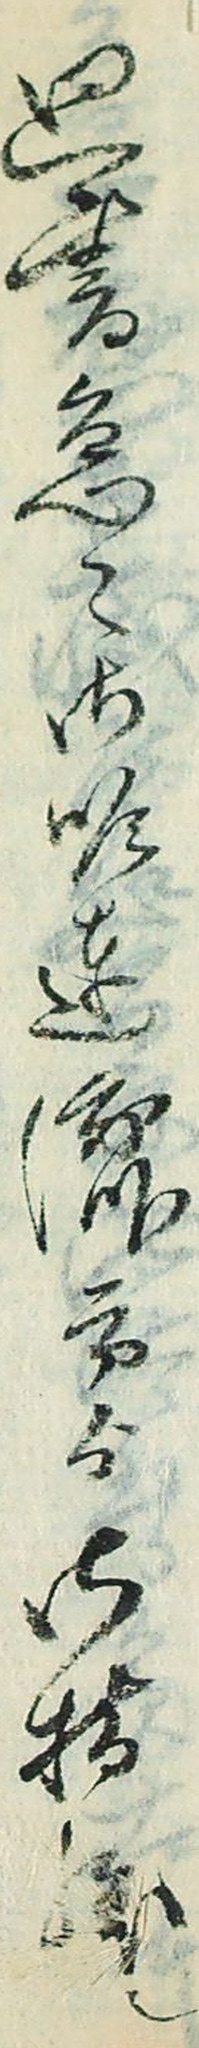廻書急々御順達済方ゟ御指渡シ
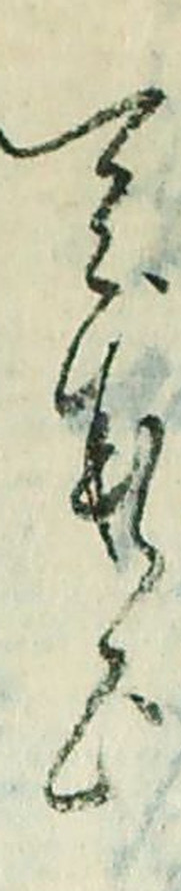可被成候以上
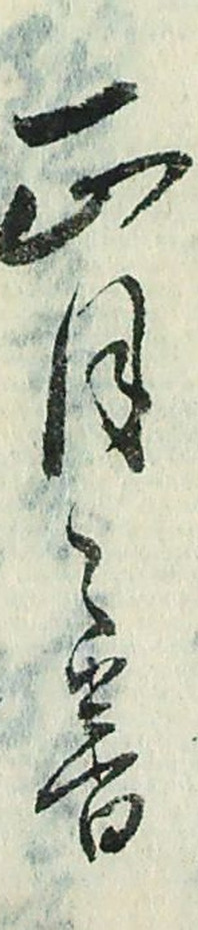正月々番
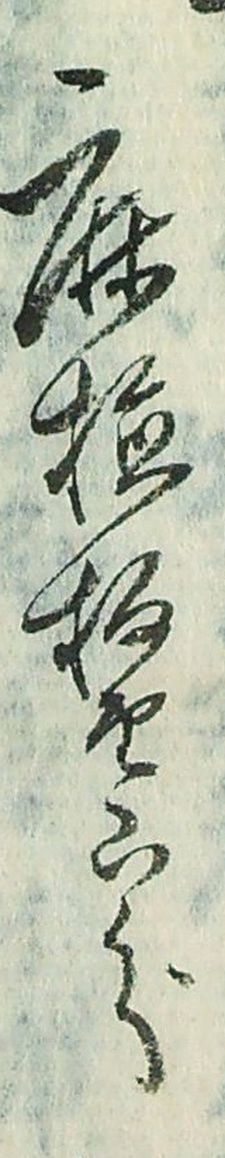麻植板野山分
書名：諸御趣意書并御下知向之写
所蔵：鳴門教育大学 Naruto University of Education
